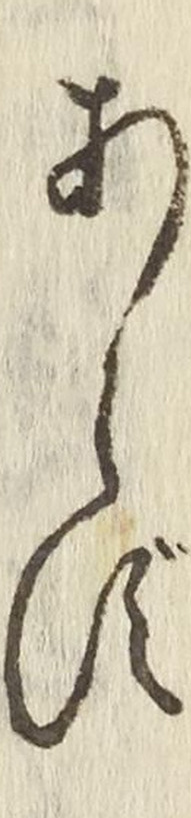あらず
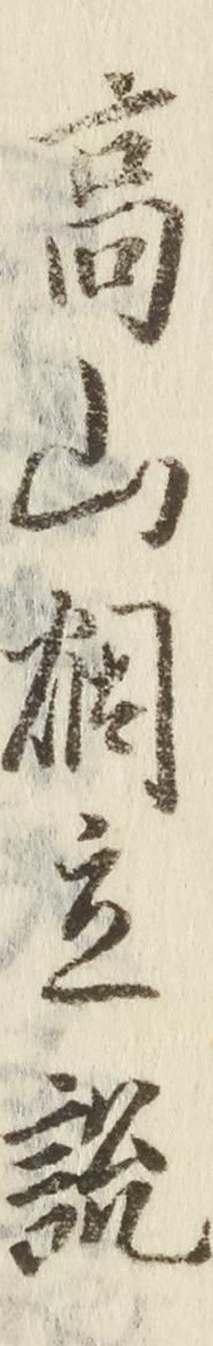高山相立説
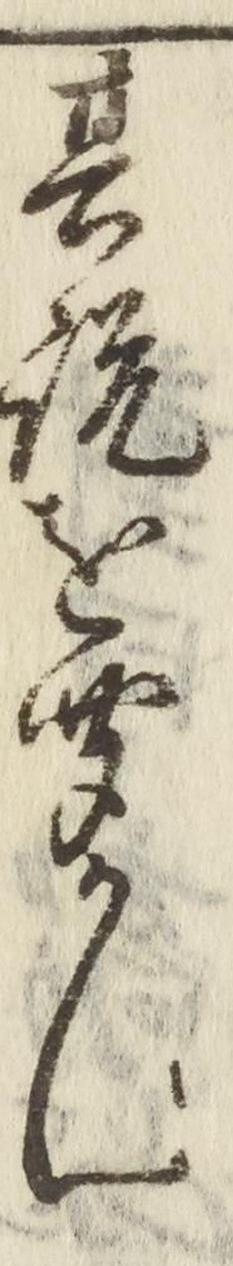其説を聞かん

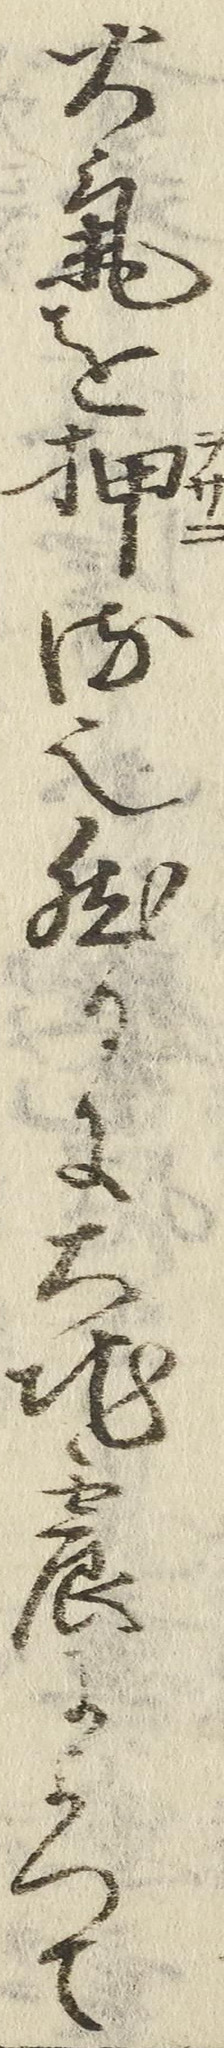火気を押る也然るに大地震によつて
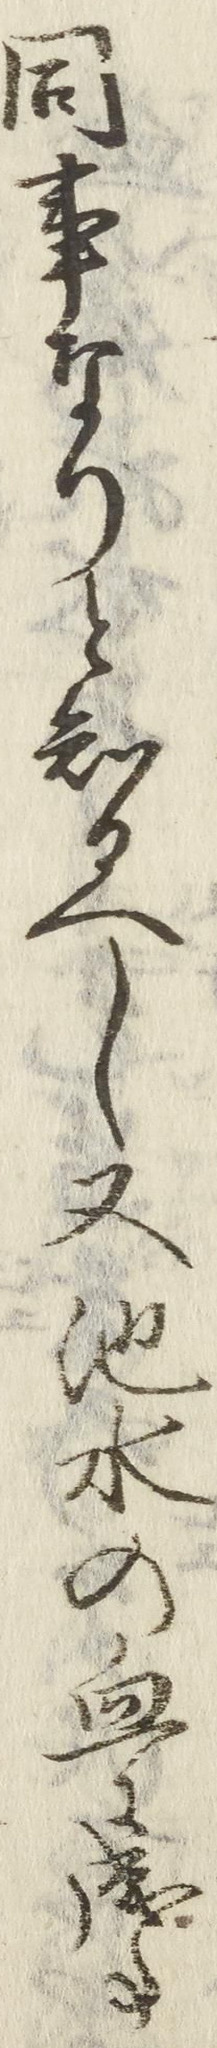同事なりと知るへし又池水の血に成事

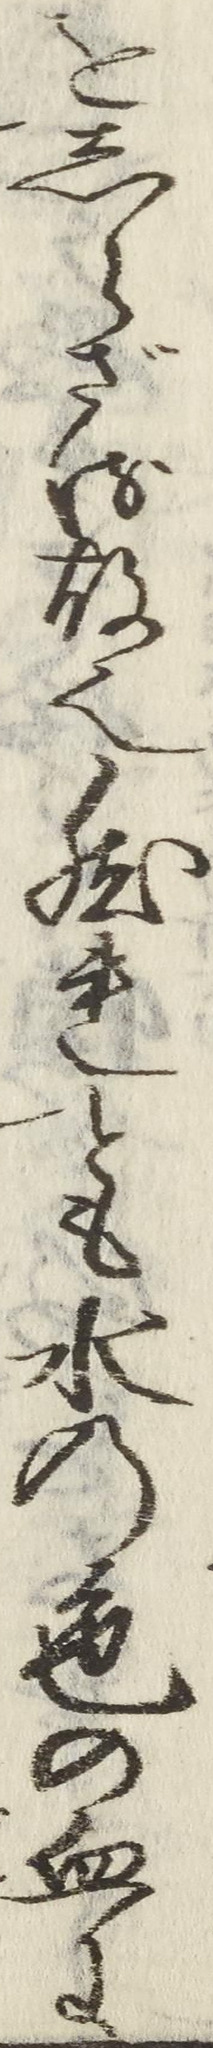をしらざる故也然れとも水の色の血に

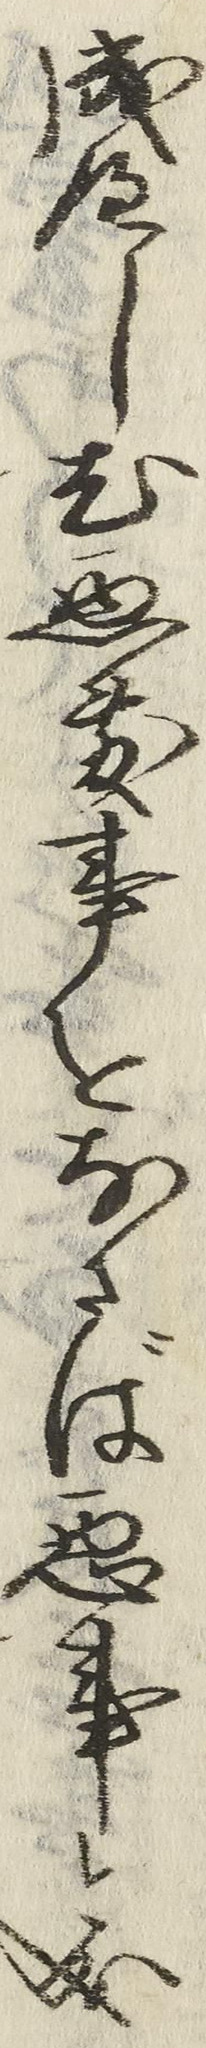成へし尤悪敷事をなさば悪事と成
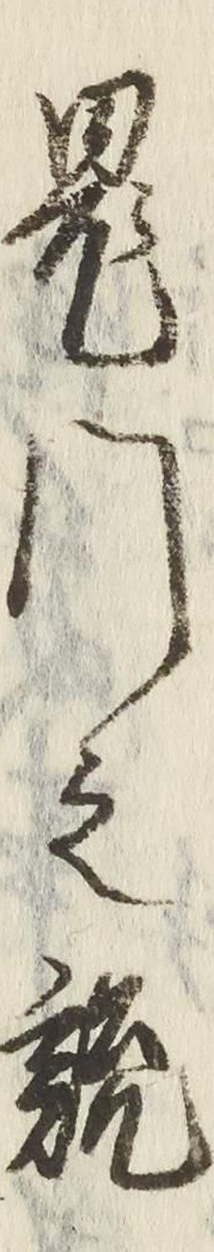鬼門の説
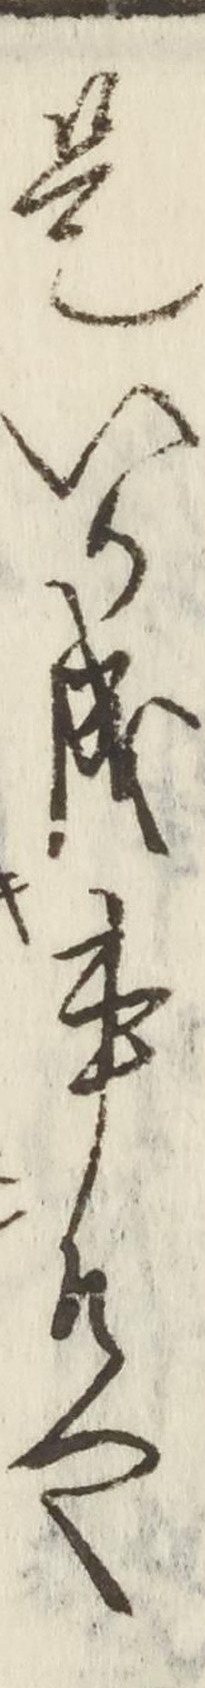是いか成事そや

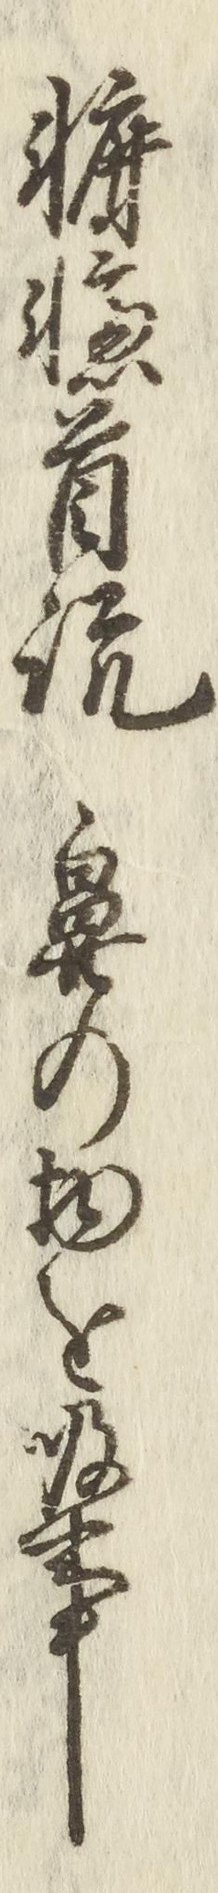轆轤首説鼻の物を吸事

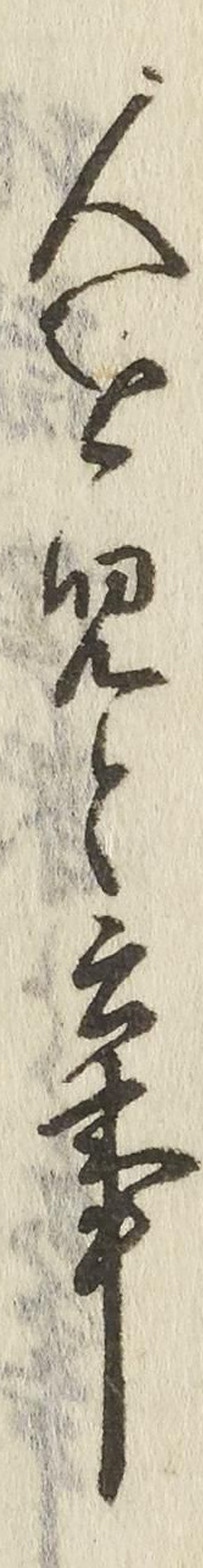人を児と云事
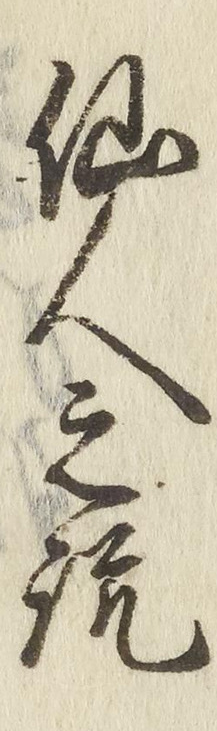仙人之説
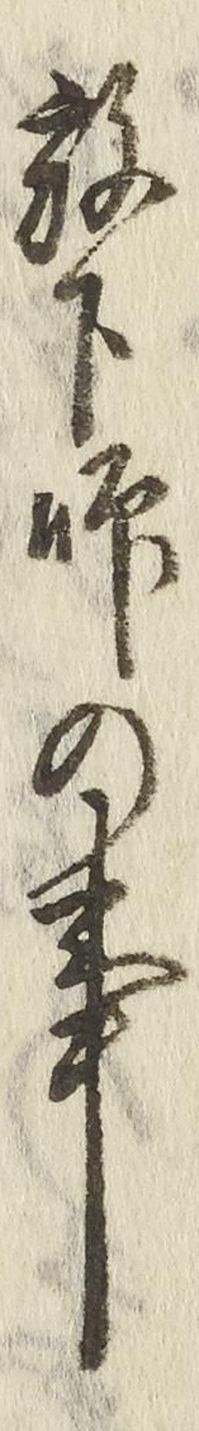放下師の事
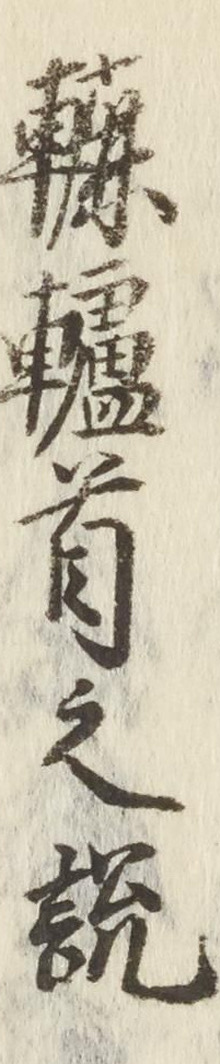轆轤首之説
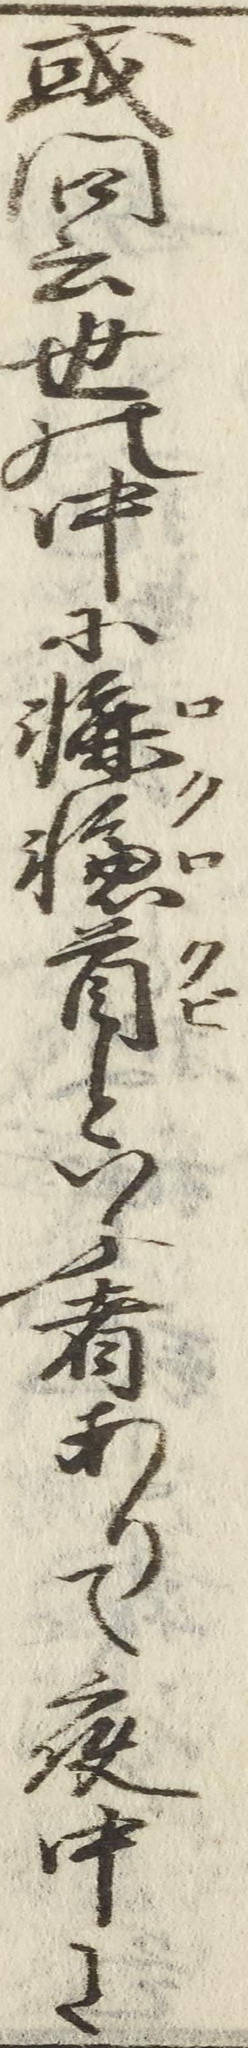或問云世の中に轆轤首といふ者ありて夜中に
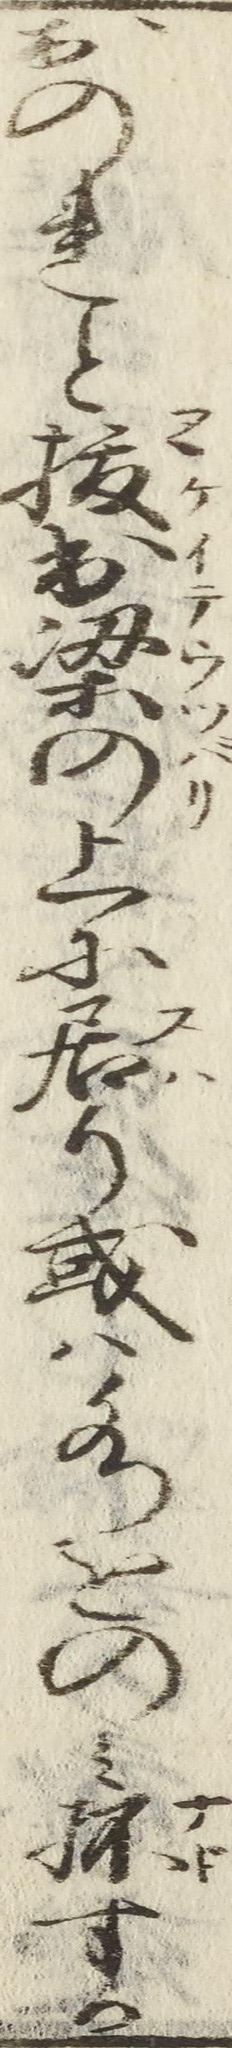おのれと抜出梁の上に居り或は水をのみ抔する
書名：天地或問珍　地
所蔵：東京大学地震研究所図書室 Earthquake Research Institute Library, The University of Tokyo, JAPAN
